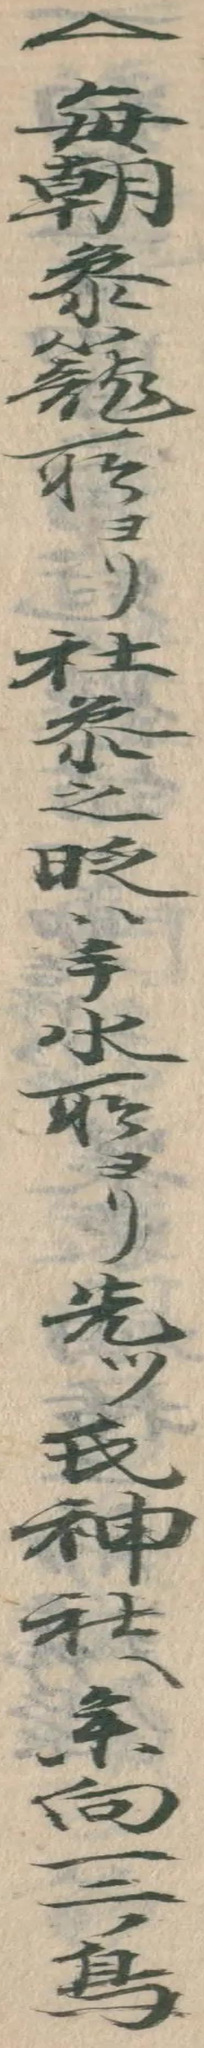△毎朝参籠所ヨリ社参之時ハ手水所ヨリ先ツ氏神社へ参向一二ノ鳥

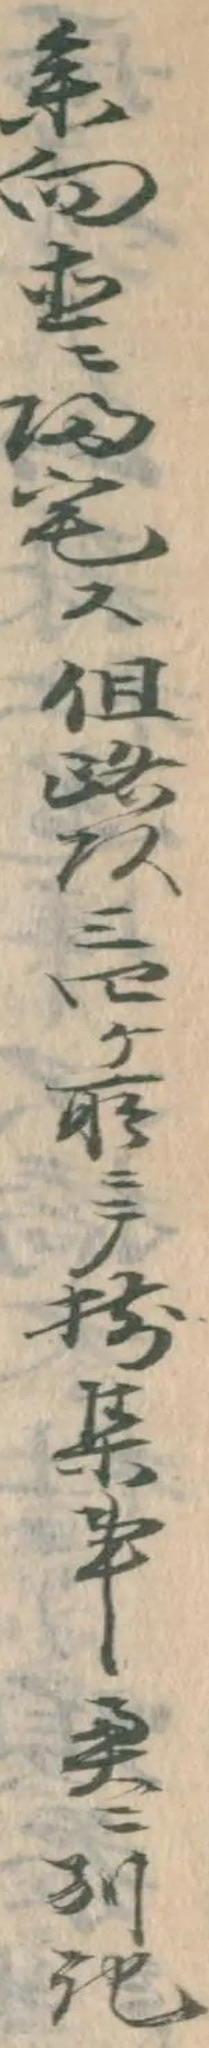参向直ニ帰宅ス但路次三四ヶ所ニテ揃集事奥ニ別記
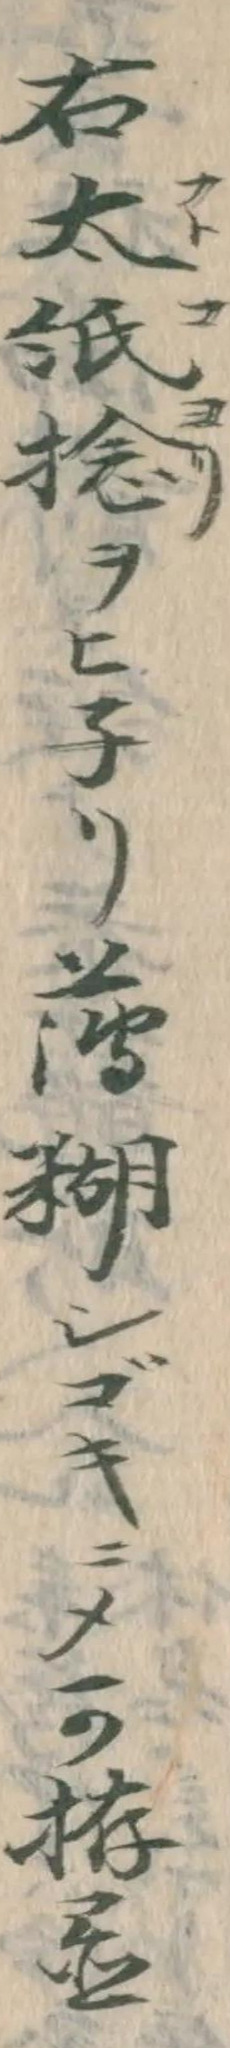右太紙捻ヲヒネリ薄糊シゴキニシメ可拵置
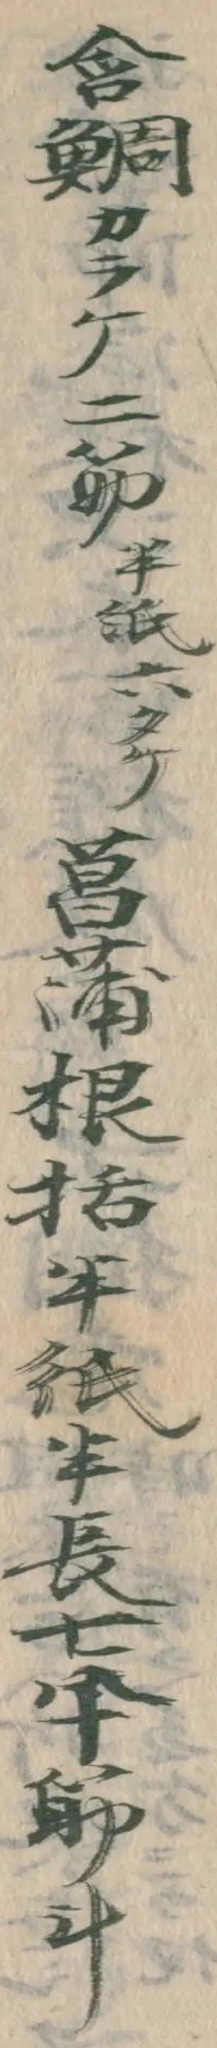含鯛カラケ二筋半紙六タケ菖蒲根括半紙半長七八十筋計
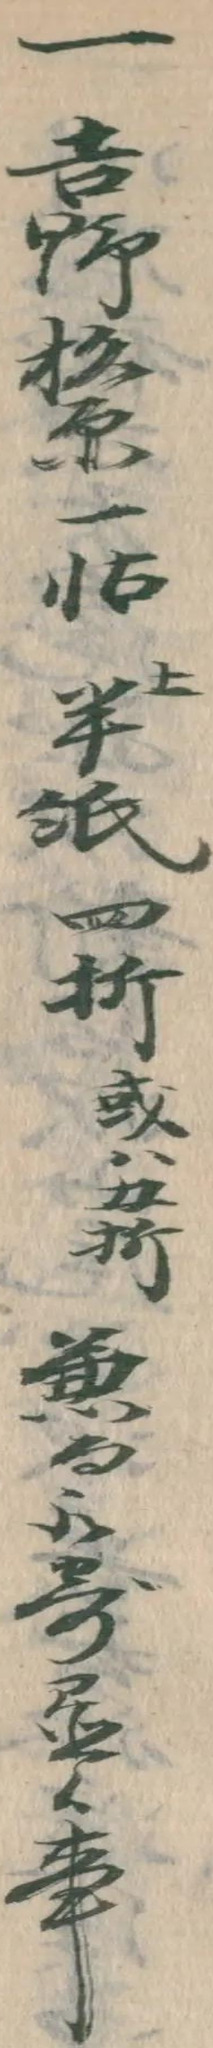一吉野杉原一帖上半紙四折或ハ五折兼而取寄置候事
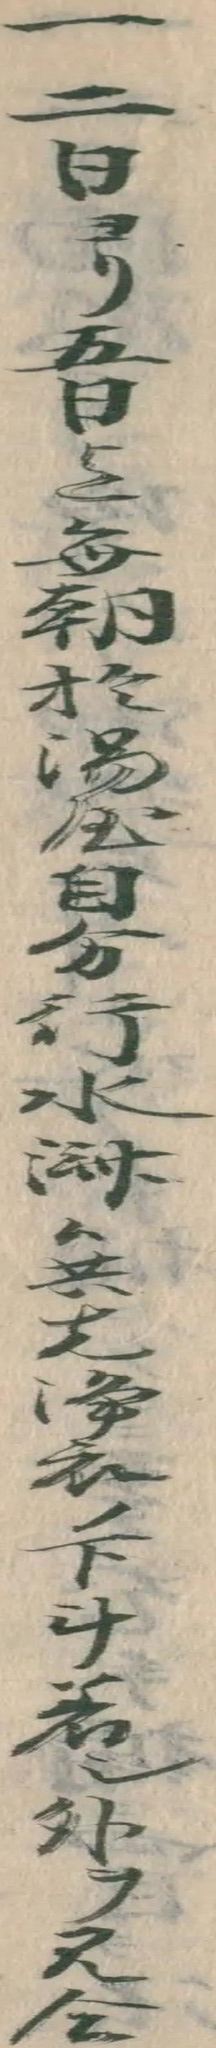一二日ヨリ五日迄毎朝於湯屋自分行水済ム共先浄衣ノ下計着シ外ヲ見合
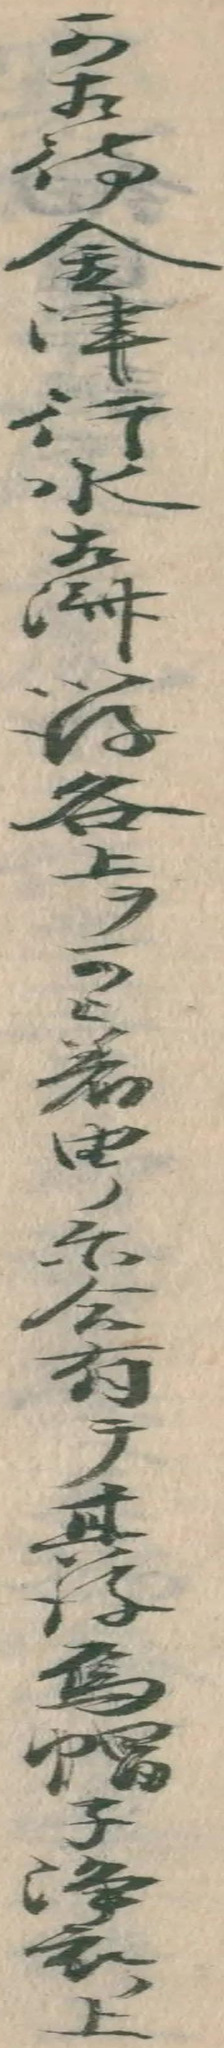可相待金津行水相済以後各上ヲ可被着由ノ示合有テ其後烏帽子浄衣ノ上
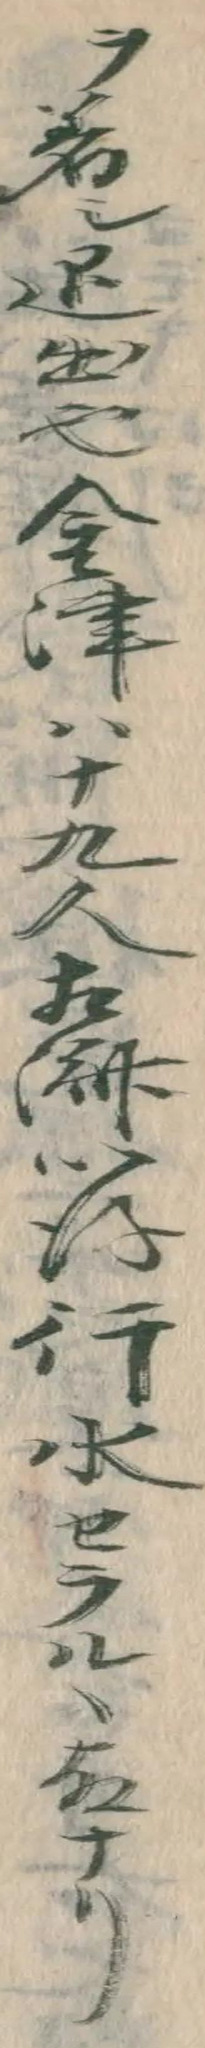ヲ着シ退出也金津ハ十九人相済以後行水セラルヽ故ナリ
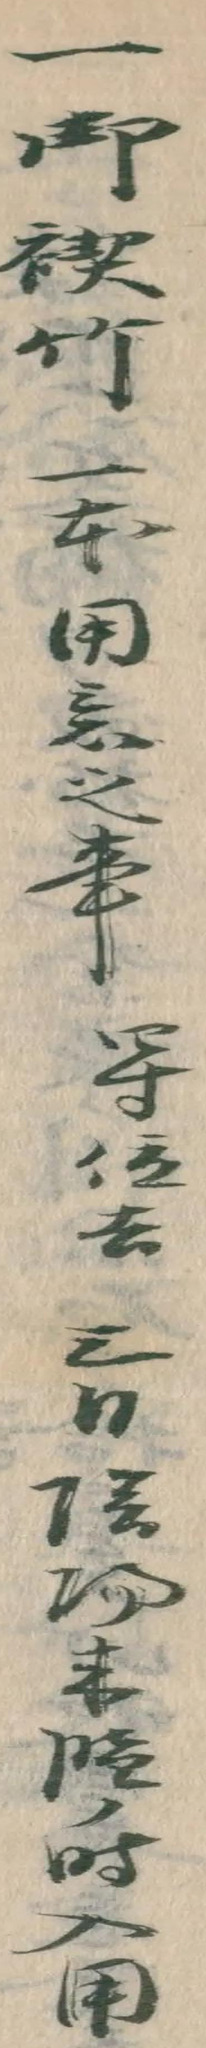一御禊竹一本用意之事四寸位去三日陰陽来臨ノ時入用
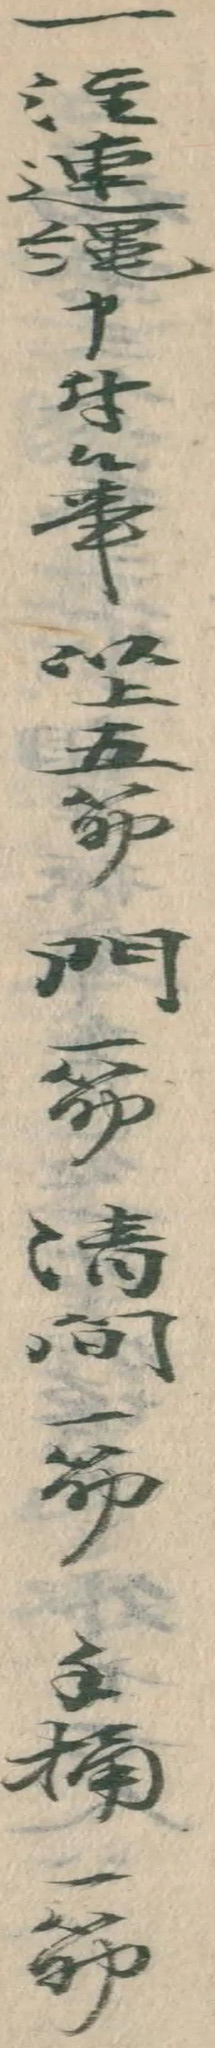一注連縄申付候事以上五筋門一筋清間一筋手桶一筋

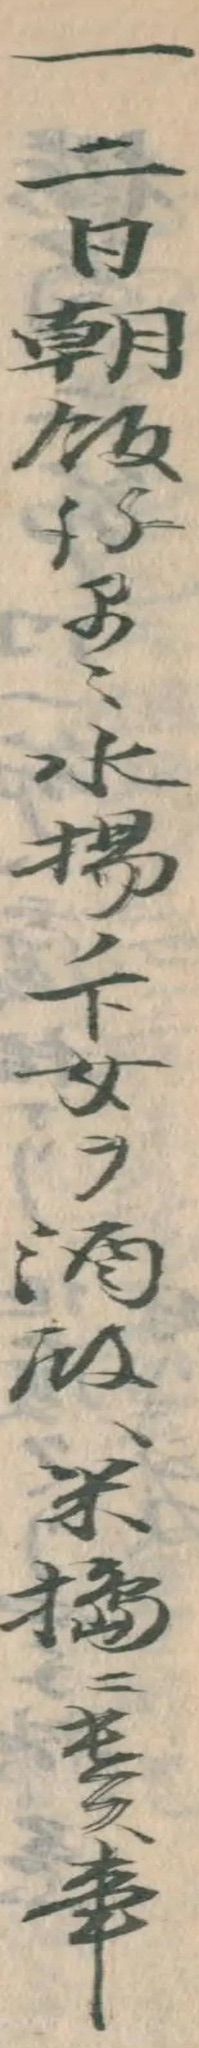一二日朝飯後早々水揚ノ下女ヲ酒殿へ米搗ニ遣ス事
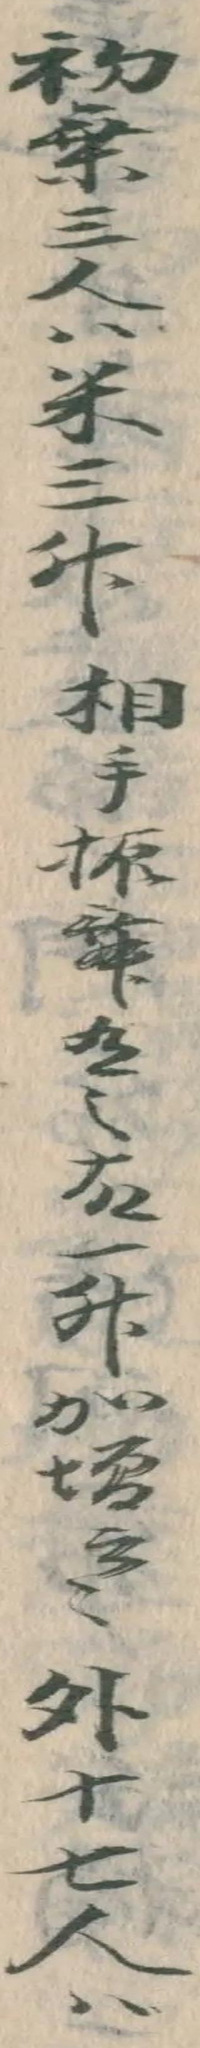初乗三人ハ米三升相手振舞有之故一升加増云々外十七人ハ
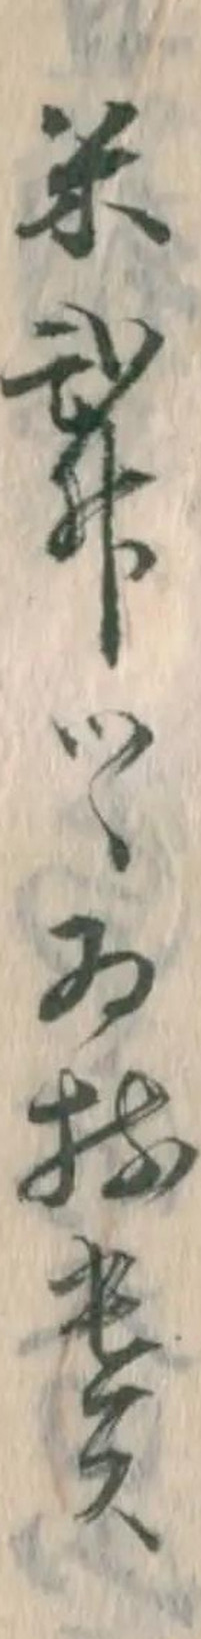米弐升ツヽ為持遣ス
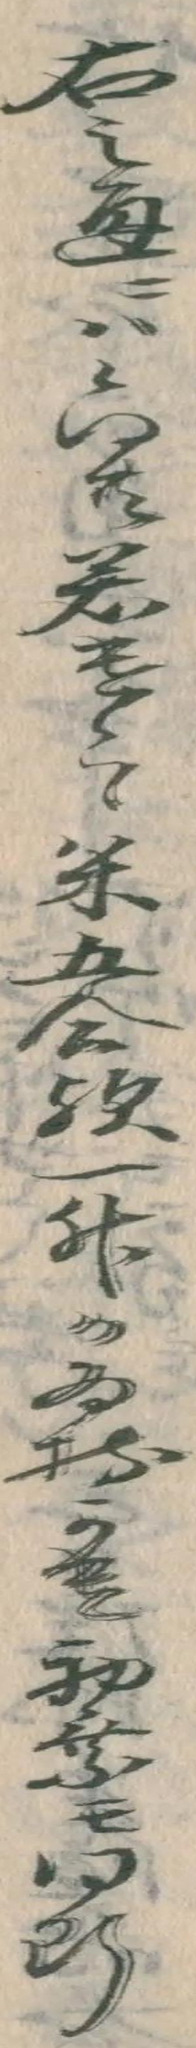右之通ニハ候得共若遣候ハヽ米五合歟一升カ為持可遣初乗モ同断
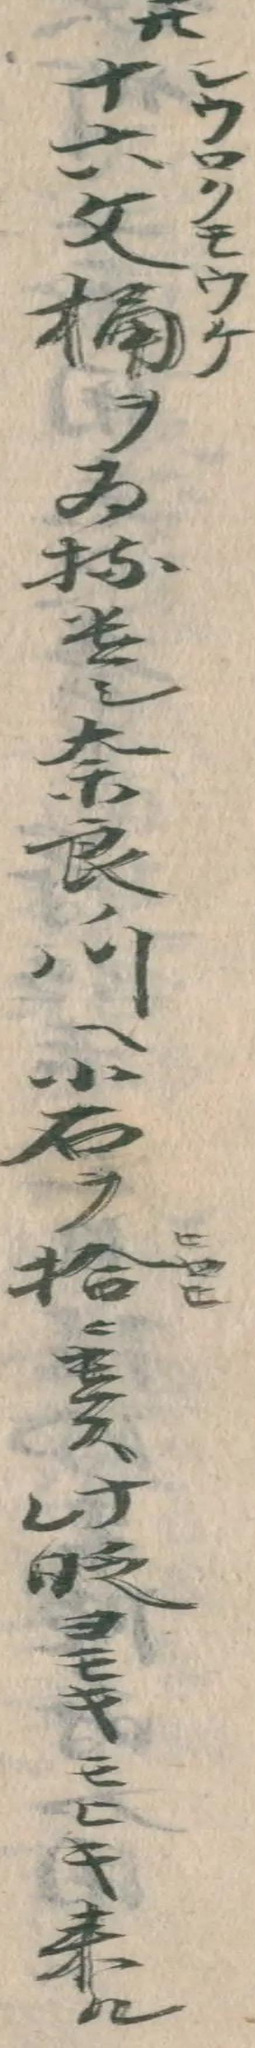并十六文桶ヲ為持遣シ奈良ノ川ヘ小石ヲ拾ニ遣ス此時ヨモキモヒキ来ル
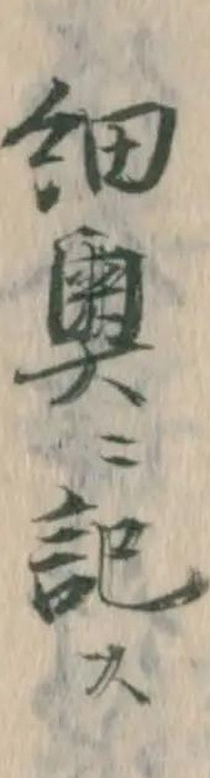細奥ニ記ス
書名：賀茂社記録. 第11冊
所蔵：国立国会図書館 National Diet Library, JAPAN
